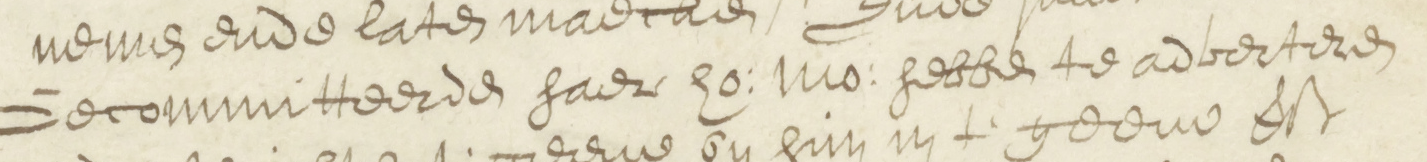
Gecommitteerden haer ho:mo: hebben te adverteren
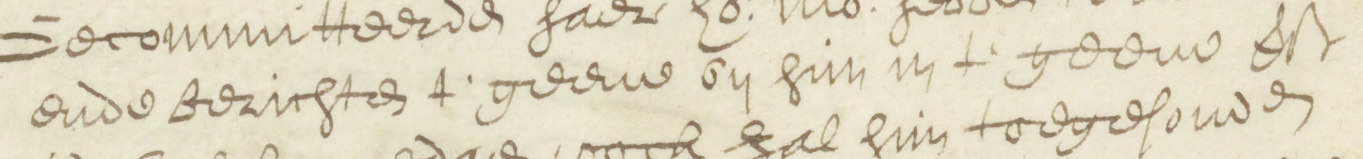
ende berichten t'geene by hun in t'geene vsz
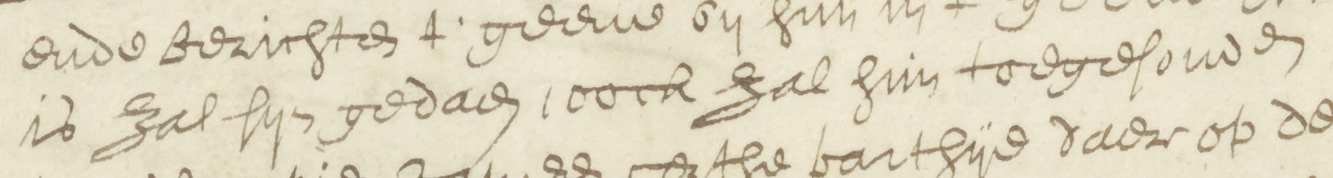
is zal syn gedaen, oock zal hun toegesonden
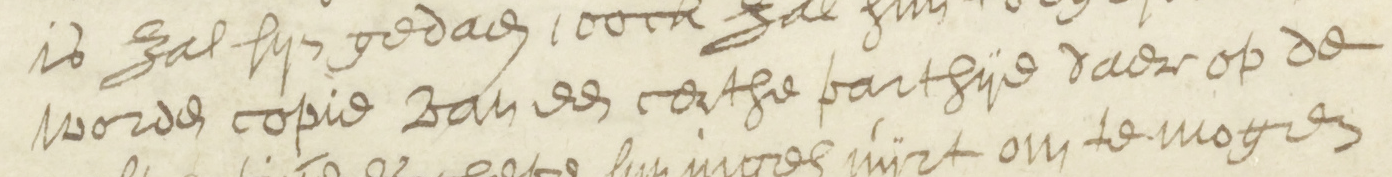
worden copie van een certhe parthije daer op de
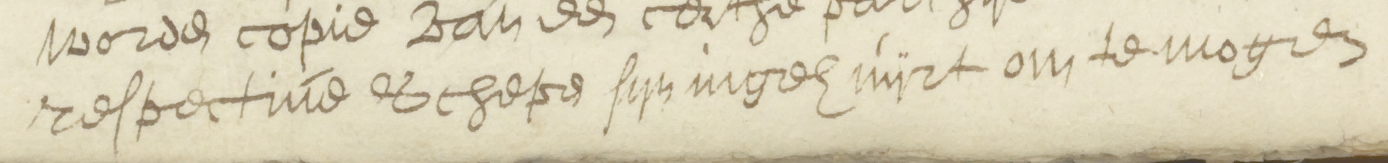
respectiue Schepen sijn ingehuijrt om te mogen
